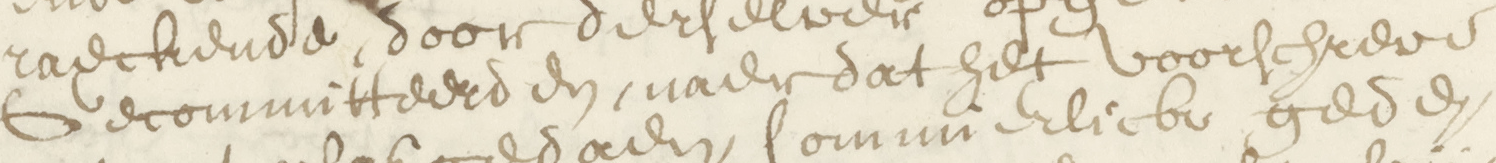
Gecommitteerden, naer dat het voorschreve
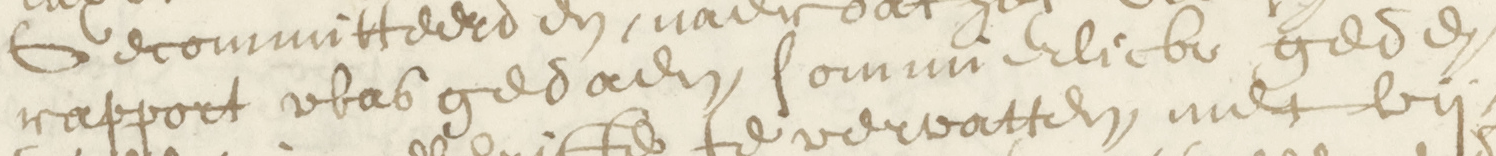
rapport was gedaen, sommierlick gede„
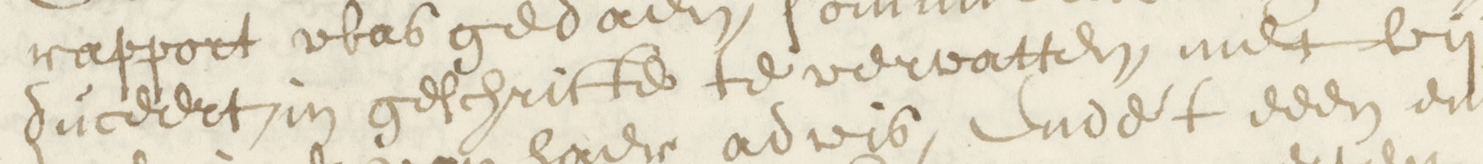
duceert, in geschrifte te vervatten, met bij„
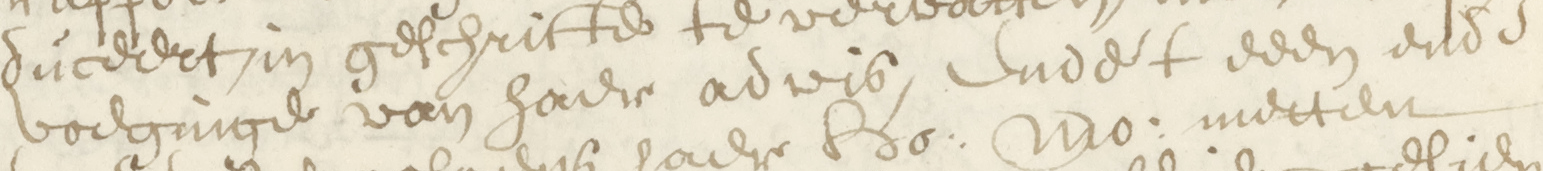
voeginge van haer advis. Ende ‛t eeen ende
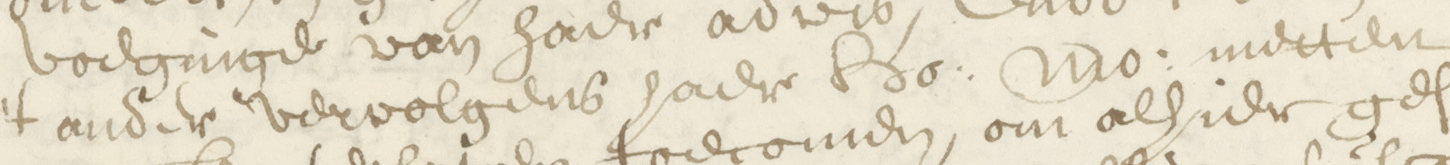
‛t ander vervolgens haer Ho:Mo: metten
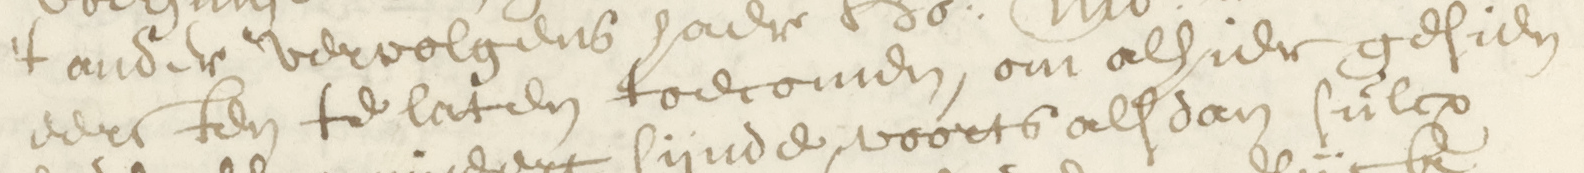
eersten te laten toecomen, om alhier gesien
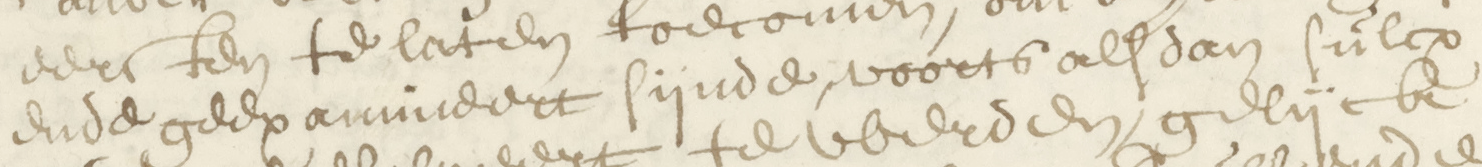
ende geexamineert sijnde, voorts alsdan sulcx
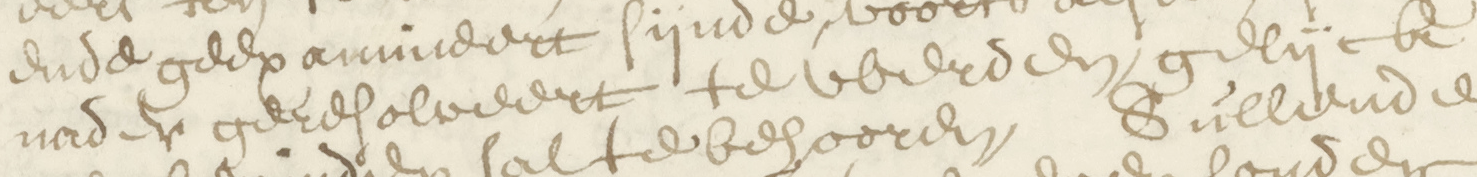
nader geresolveert te werden, gelijck
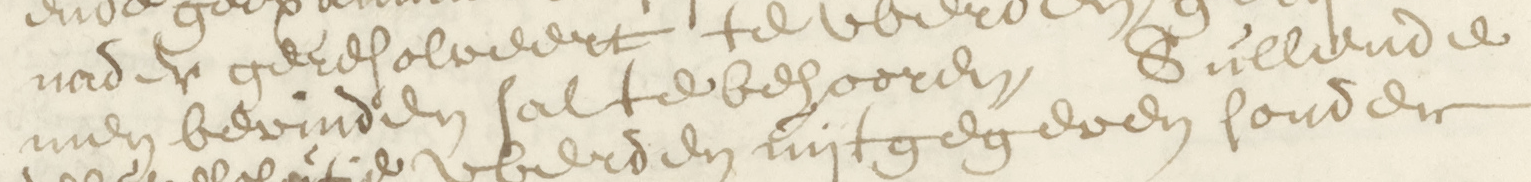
men bevinden sal te behooren, Sullende
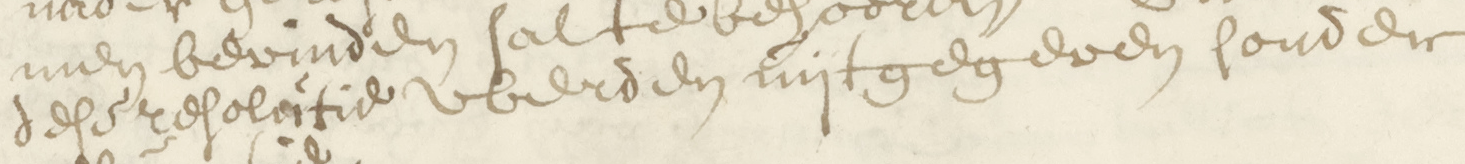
dese resolutie werden uijtgegeven sonder
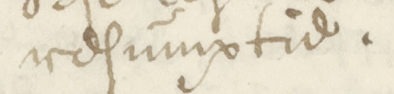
resumptie.
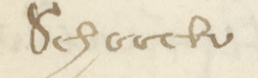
Schoock
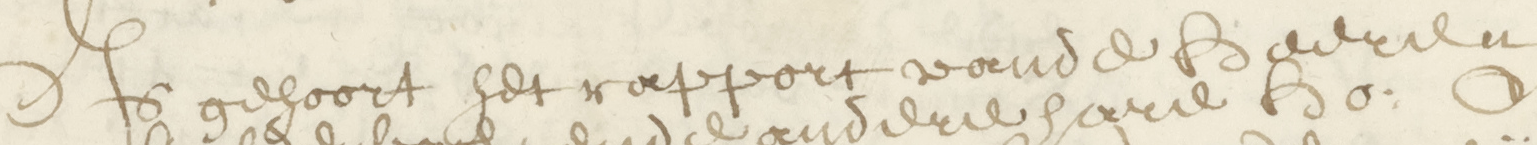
Is gehoort het rapport vande Heeren
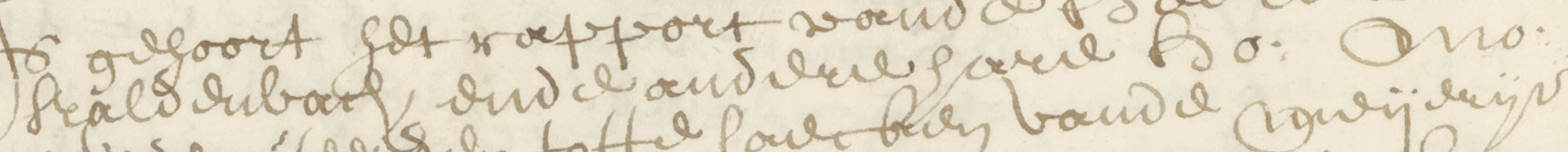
Kaldenbach, ende andere hare Ho:Mo:
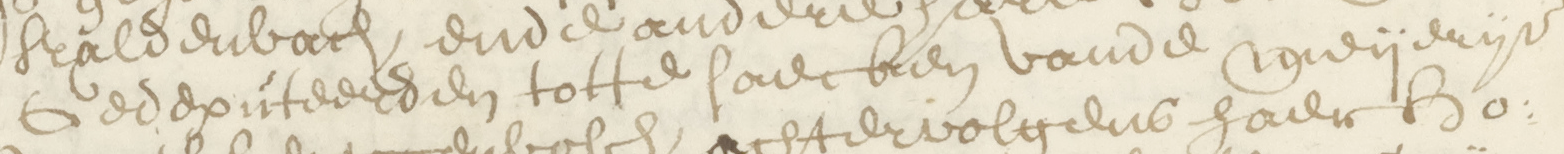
Gedeputeerden totte saecken vande meijerije
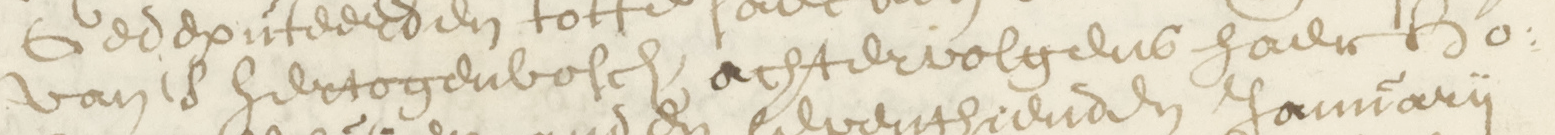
van ‛s hertogenbosch, achtervolgens haer Ho:
